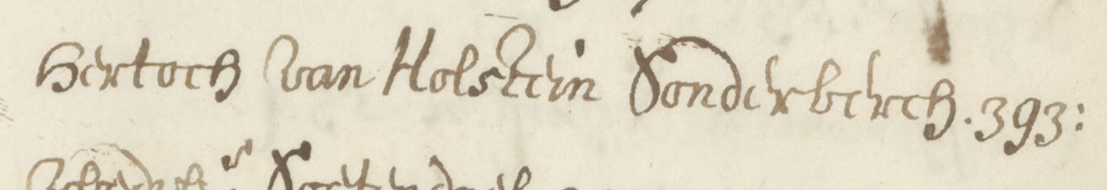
hertoch van Holstein Sonderberch. 393:
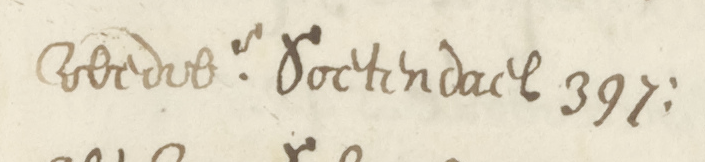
Wedwe. Soetendael 397:
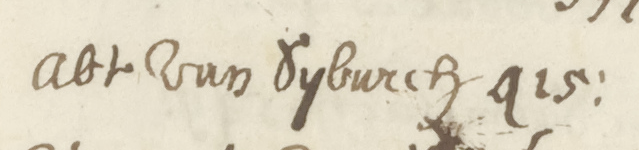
Abt van Syburch 415:
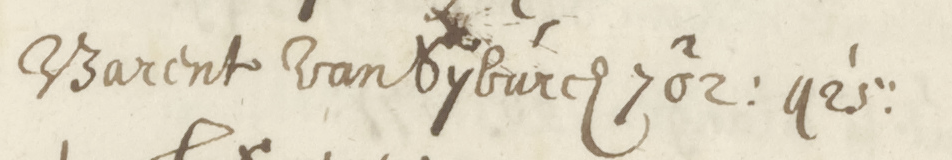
Barent van Sijburch 7022: 4215:
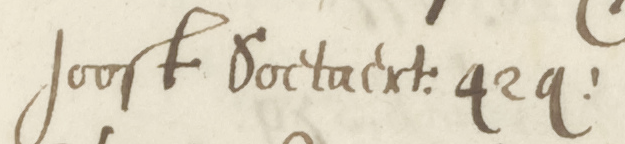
Joost Soetaert. 424:
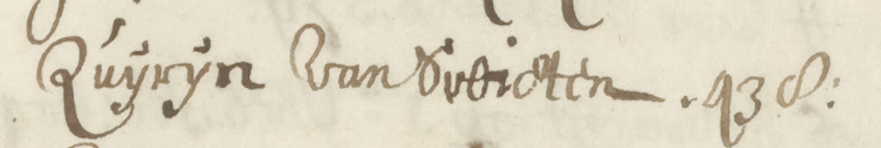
Quijrijn van Swieten. 438:
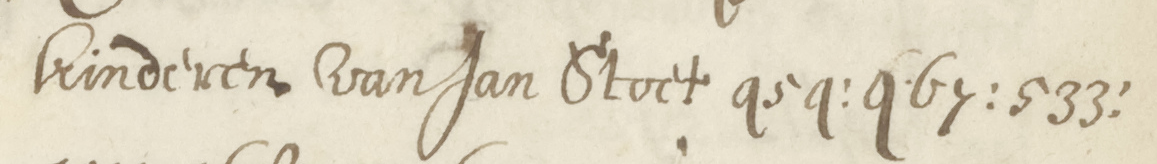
kinderen van Jan Stoet 454: 467: 533:
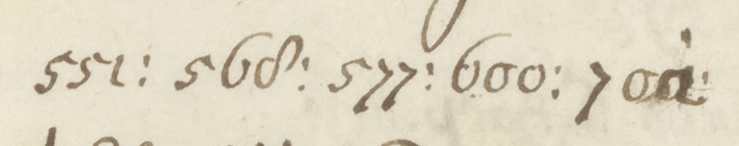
551: 568: 577: 600: 701:
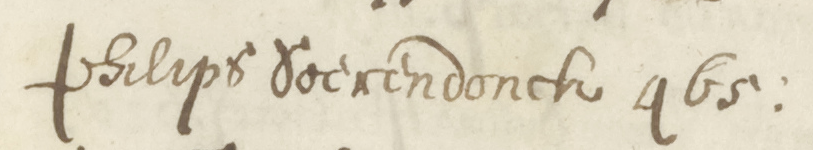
Philips Soerendonck 465:
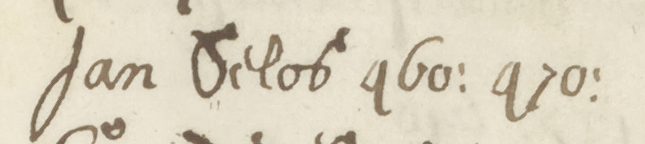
Jan Selos 460: 470:
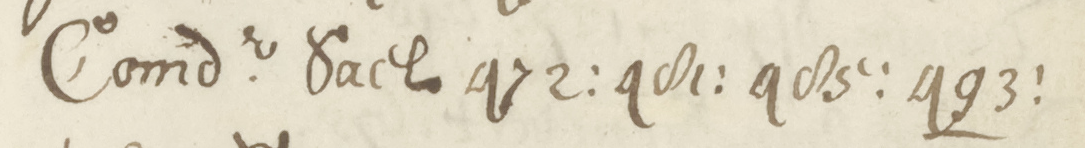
Comdr. Sael 472: 481: 485: 493:
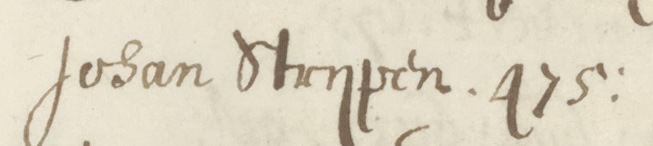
Johan Strypen. 475:
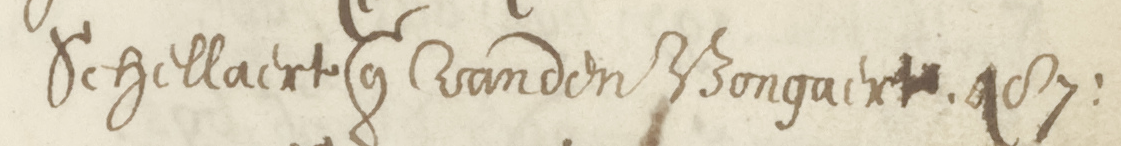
Schellaert Ca. vanden Bongaert. 487:
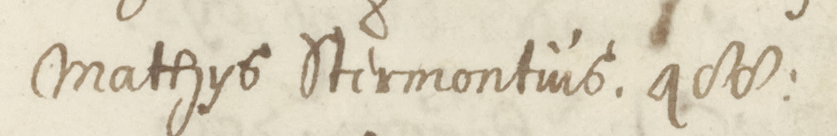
Mathys Stermontius. 488:
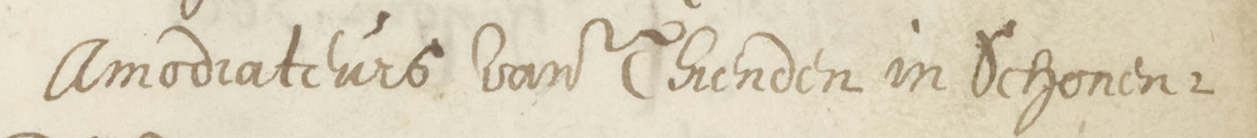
Amodiateurs van Thienden in Schonen=
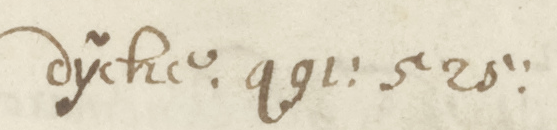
dijcke. 491: 525:
